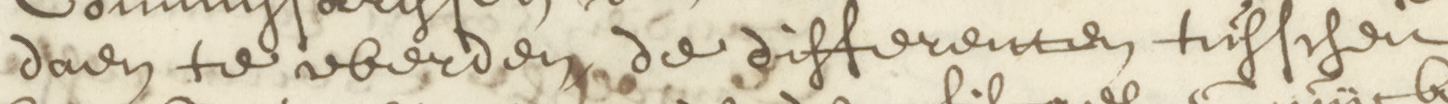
daen te werden, de differenten tusschen
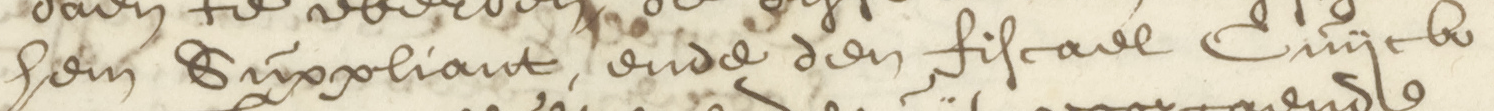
hem Suppliant, ende den fiscael Cuijck
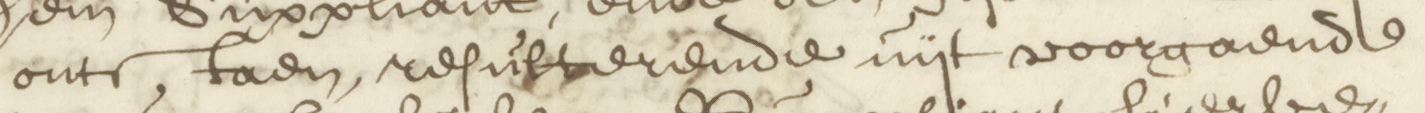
ontstaen, resulterende uijt voorgaend
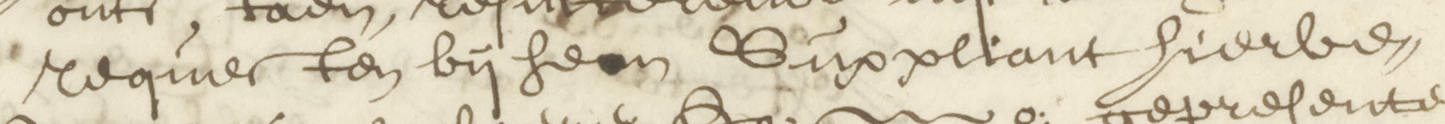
requesten bij hem Suppliant hierbe„
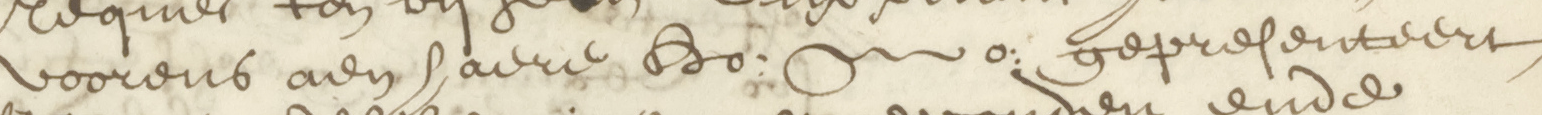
voorens aen haere Ho:Mo: gepresenteert;
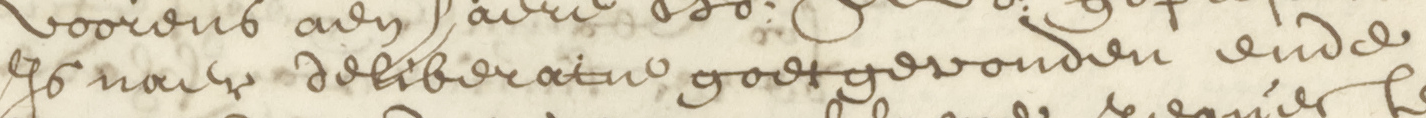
Is naer deliberatie goetgevonden ende
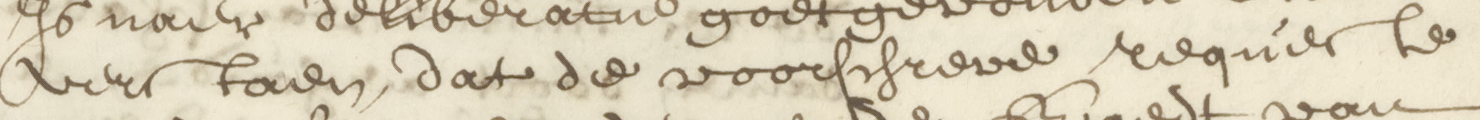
verstaen, dat de voorschreve requeste
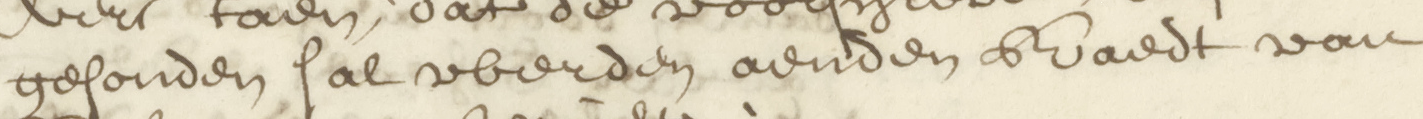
gesonden sal werden aenden Raedt van
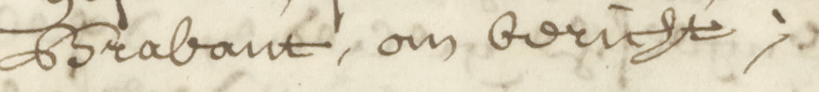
Brabant, om bericht;
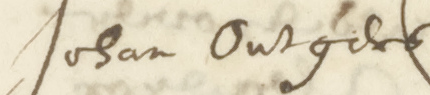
Johan Outgers
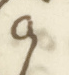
Ca
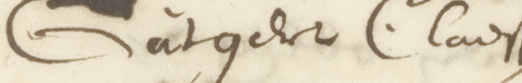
Outger Claesz.
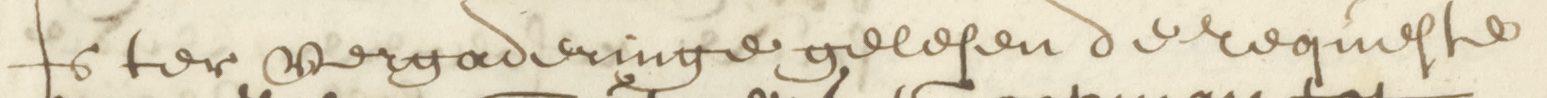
Is ter Vergaderinge gelesen de requeste
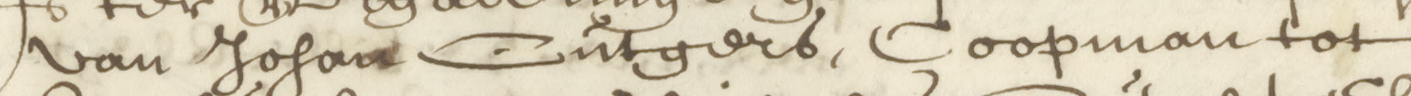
van Johan Outgers, Coopman tot
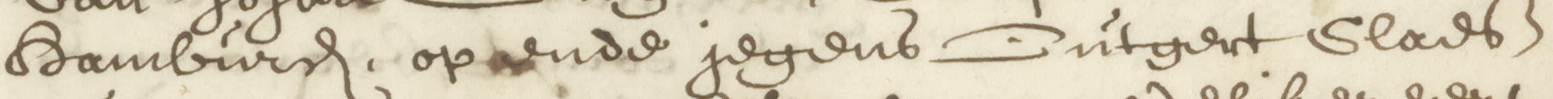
Hamburch, op ende jegens Outgert Claesz.
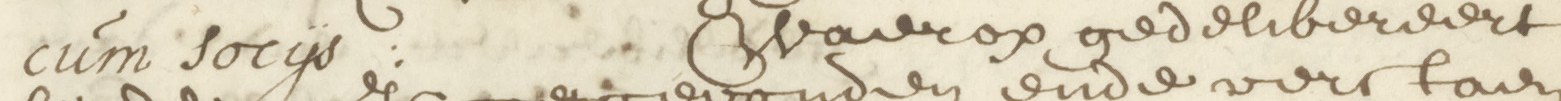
cum socijs: Waerop gedelibereert
